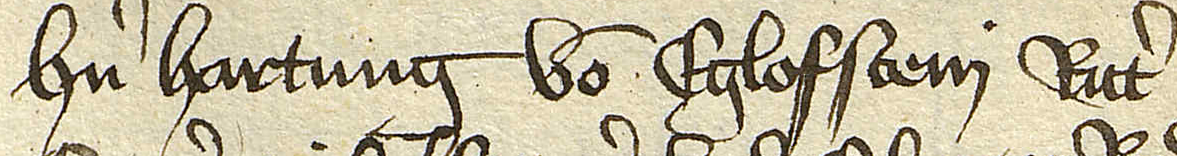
hn* hartung vo* Eglofſtein Ritt*
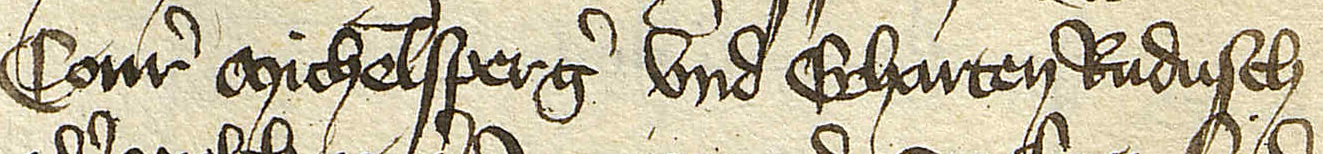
Conr* Michelſperg* vnd Erharten Ruduſch
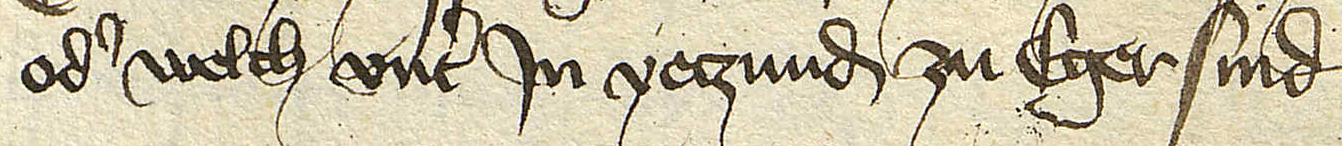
od* welch vnt* In yecʒund cʒu Eger ſind
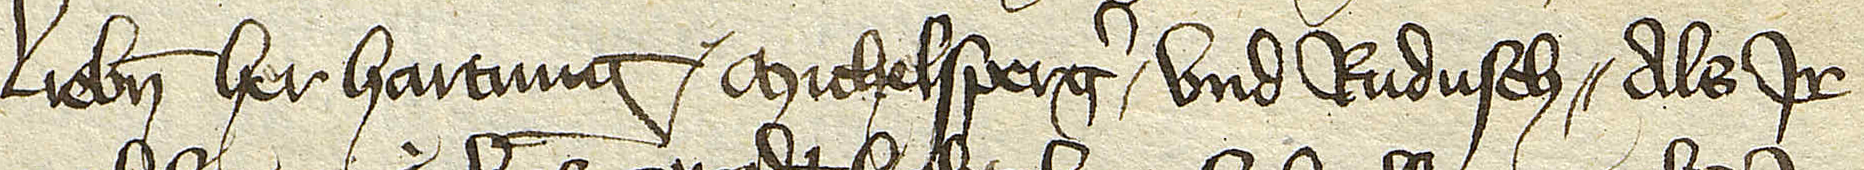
Liebn* her hartung / Michelſperg* / vnd Ruduſch // Als Ir
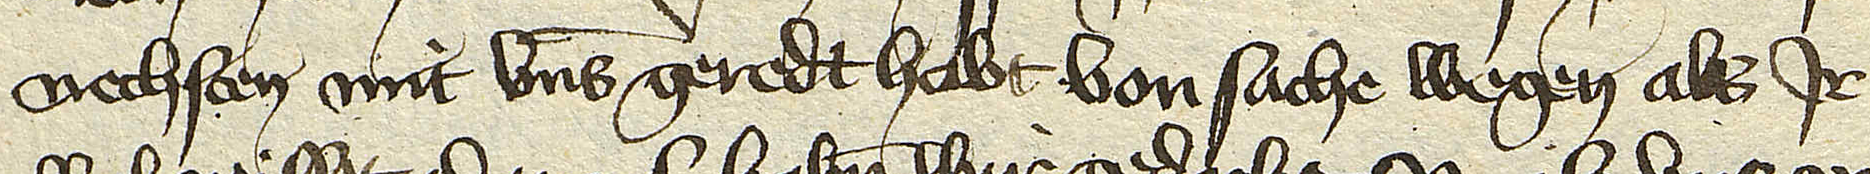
nechſten mit vns geredt habt von ſache wegen als Ir
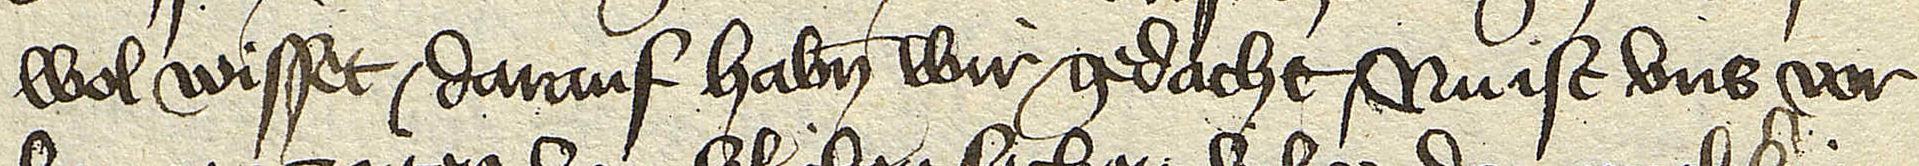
wol wiſſet / darauf habn* wir gedacht / Nu iſt vns vor
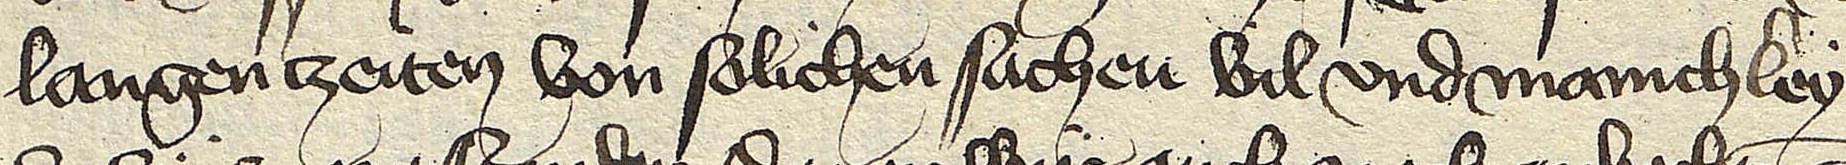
langen cʒeiten von ſolichen ſachen vil vnd manich*ley
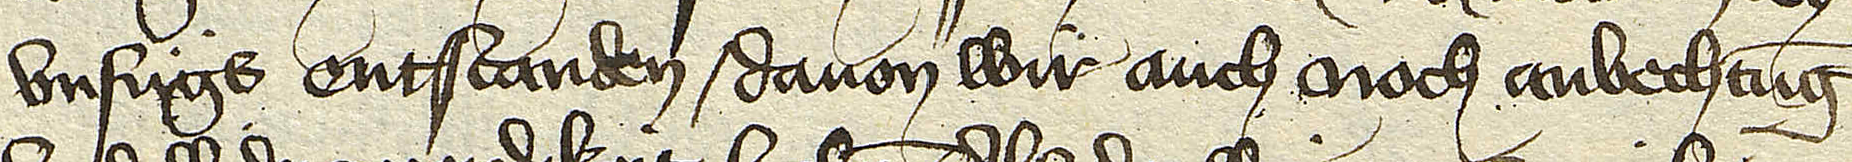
vnfügs entſtanden / dauon wir auch noch anvechtug*
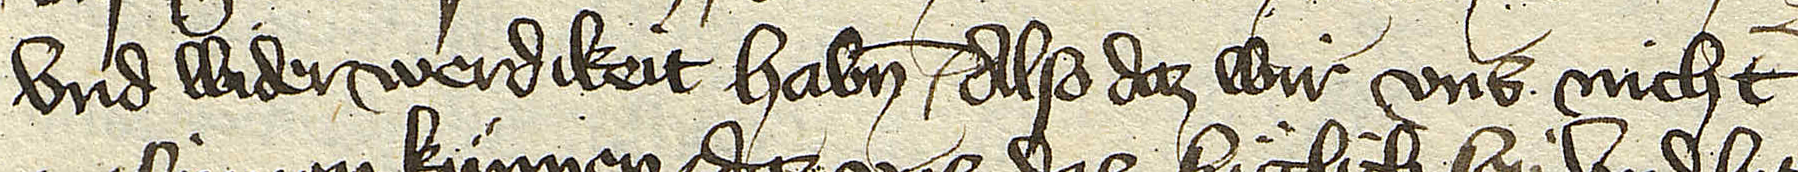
vnd widerwerdikeit habn* / Alſo daʒ wir vns nicht
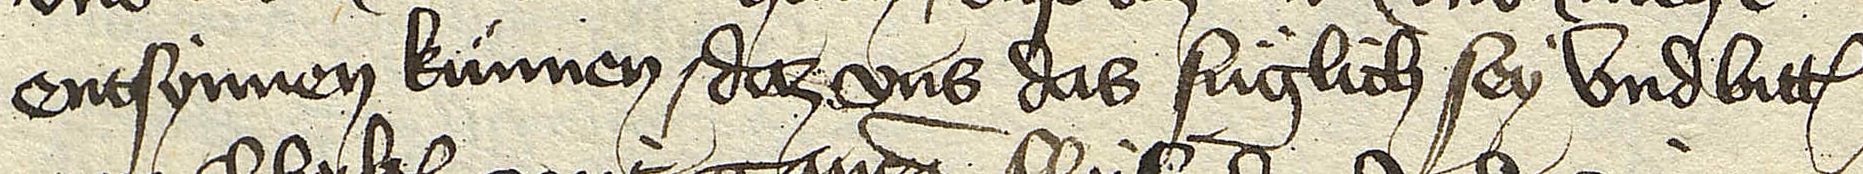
entſynnen künnen / daʒ vns das füglich ſey vnd bitt*
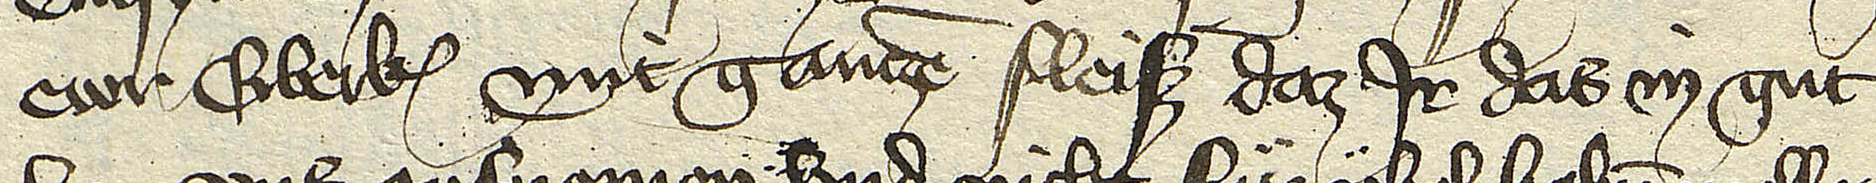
ewr Erberk* mit gancʒe* fleiſʒ* daʒ Ir das in gut
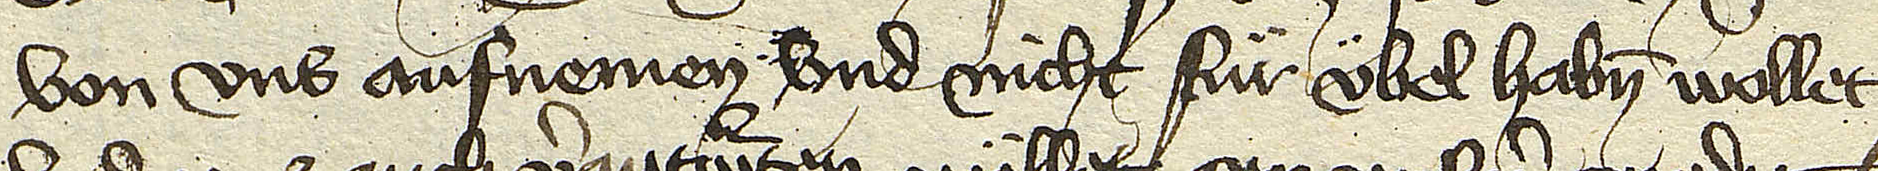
von vns aufnemen vnd nicht für v̈bel habn* wollet
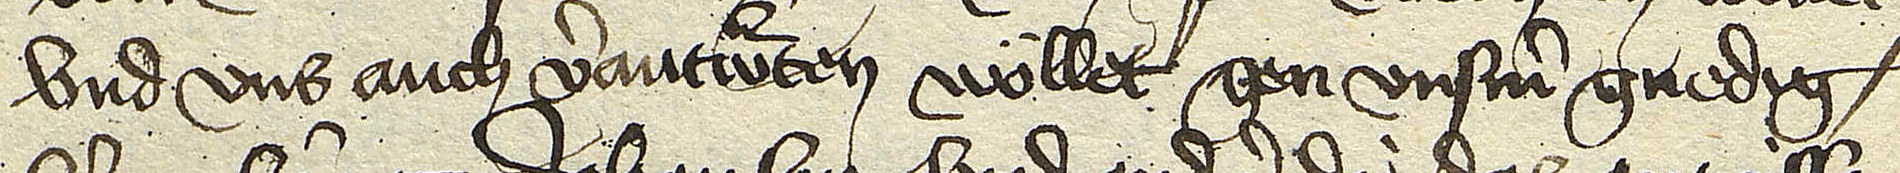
vnd vns auch v*antwt*en wöllet gen vnſm* gnedig*
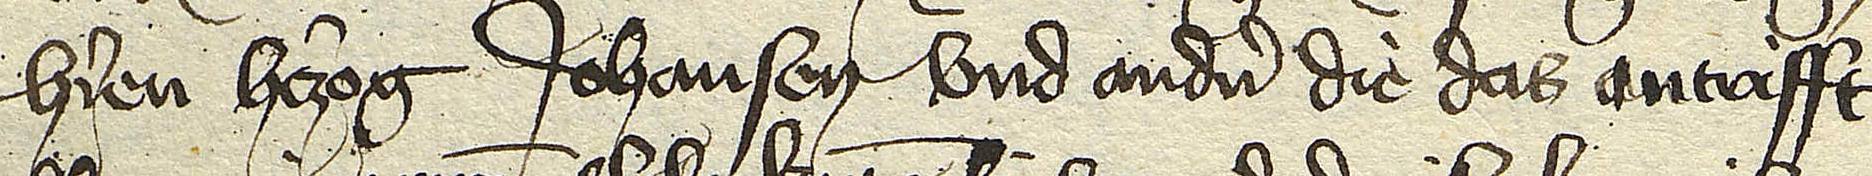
hr*en h*cʒog Iohanſen vnd andn* die das antrifft
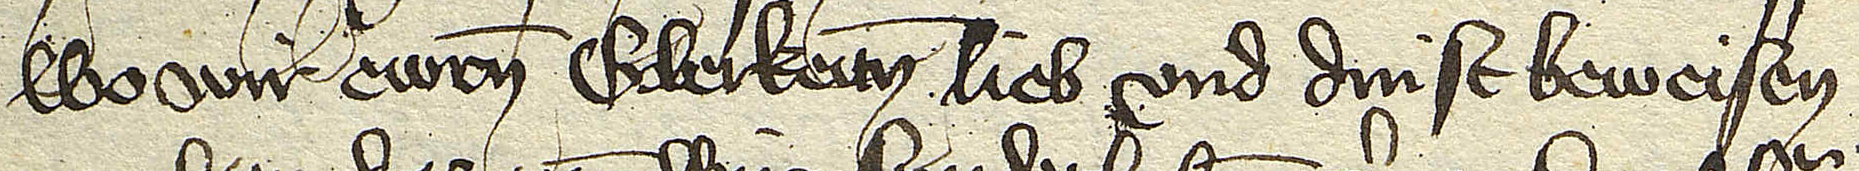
wo wie ewrn* Erberkeitn* lieb vnd dinſt beweiſen
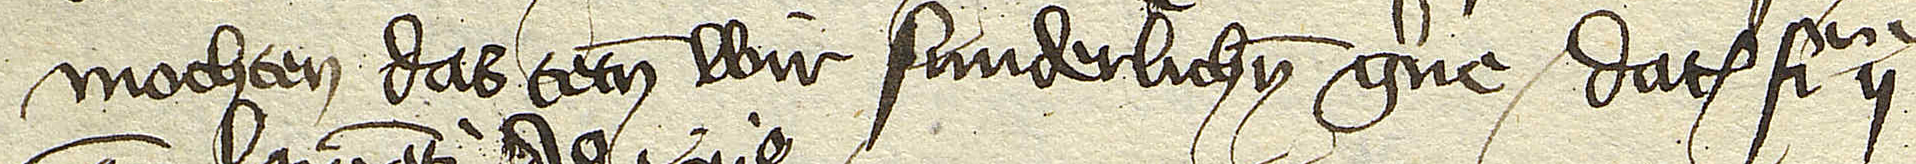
mochten das tetn* wir ſunderlichn* g*ne / dat* fi* ii*
